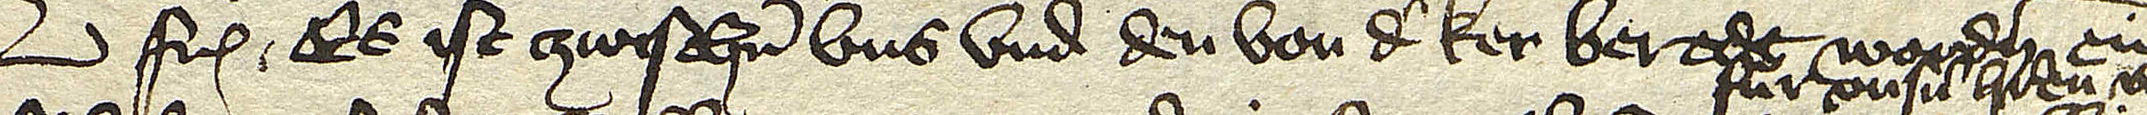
L* fr* / Es iſt cʒwiſchn* vns vnd den von d* ker beredt wordn* ein
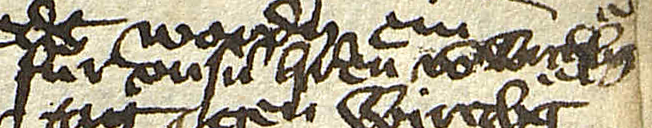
für vnſn* hr*en vo* wircʒb*g
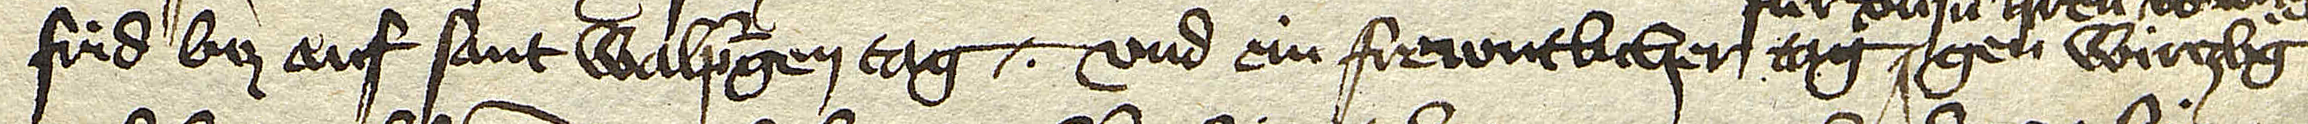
frid biʒ auf ſant walp*gen tag / . vnd ein frewntlicher tag / gen wircʒb*g
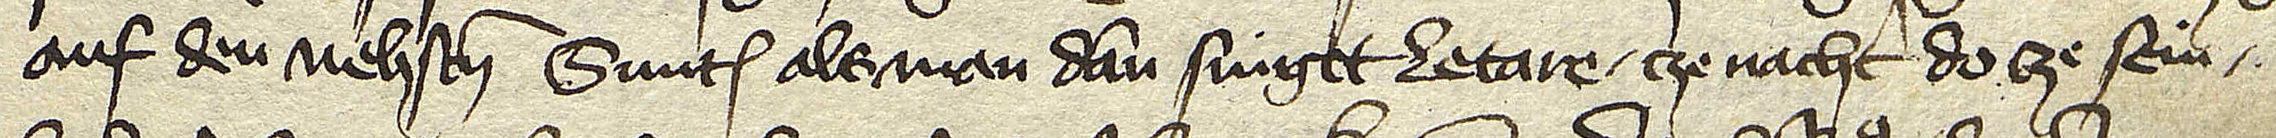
auf den nehſtn* Sunt* als man dan* ſinget Letare / cʒe nacht do cʒe ſein / .
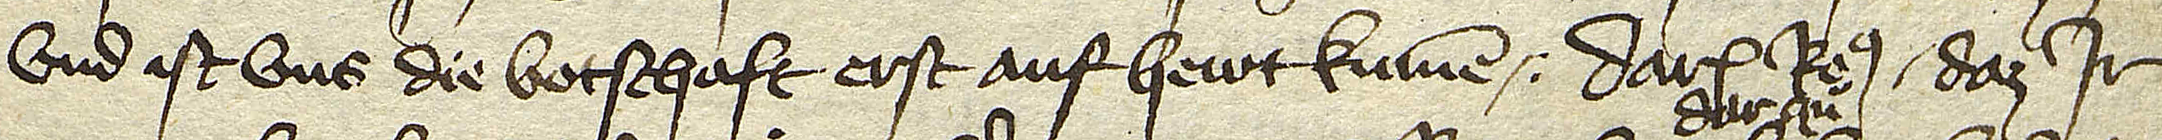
vnd iſt vns die botſchaft erſt auf hewt kume* / . Dar* Ro* / daʒ Ir
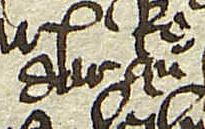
dar cʒü
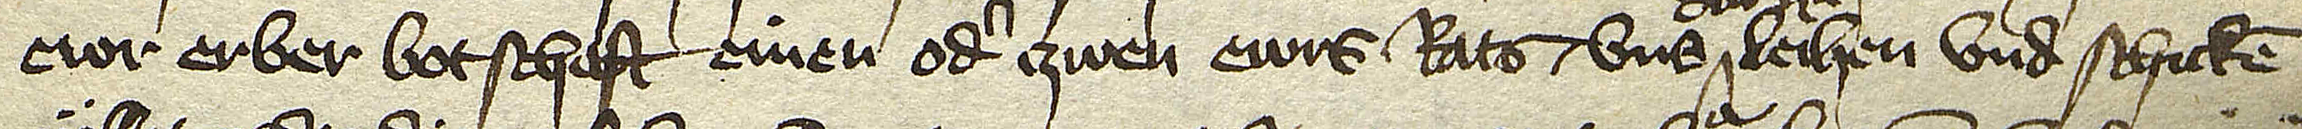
ewr erber botſchaft einen od* cʒwen ewrs Rats / vns leihen vnd ſchicke*
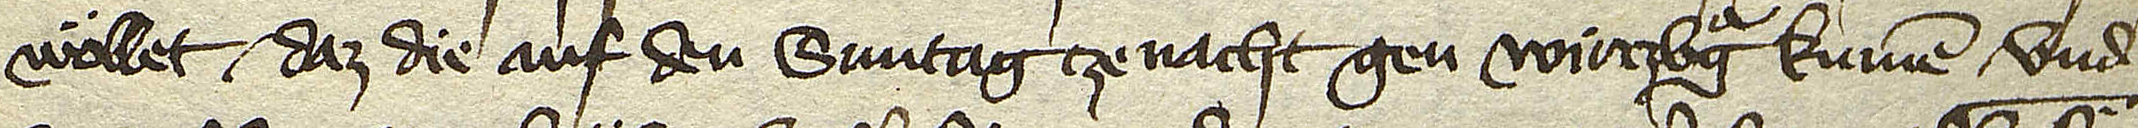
wöllet / daʒ die auf den Suntag cʒe nacht gen wircʒb*g kume* / vnd
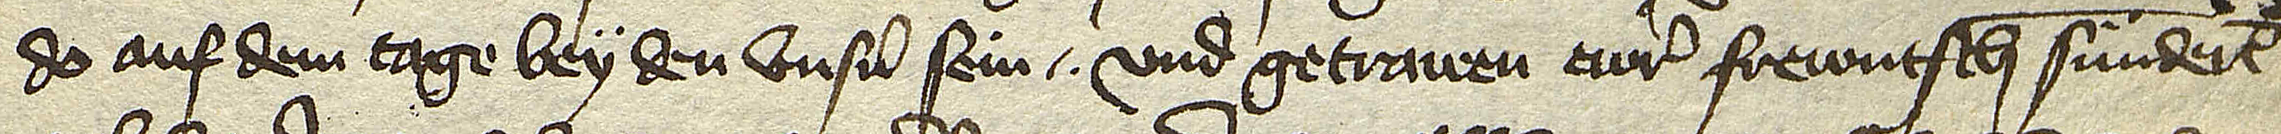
do auf dem tage bey den vnſn* ſein / . vnd getrawen ewr* frewntſch* ſünderl*
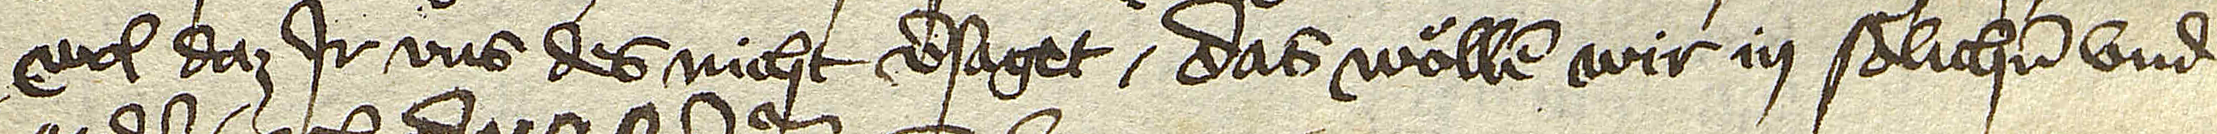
wol daʒ Ir vns des nicht v*ſaget / Das wölle* wir in ſolichn* vnd
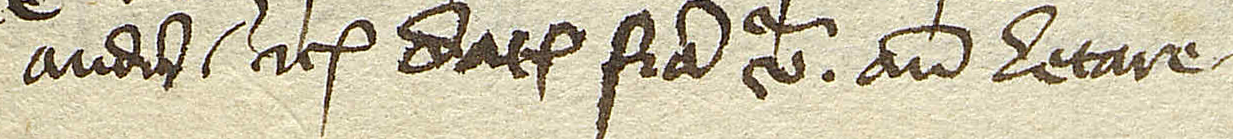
andn* / ec* Dat* fia* v* . an* Letare /
